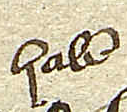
hab*
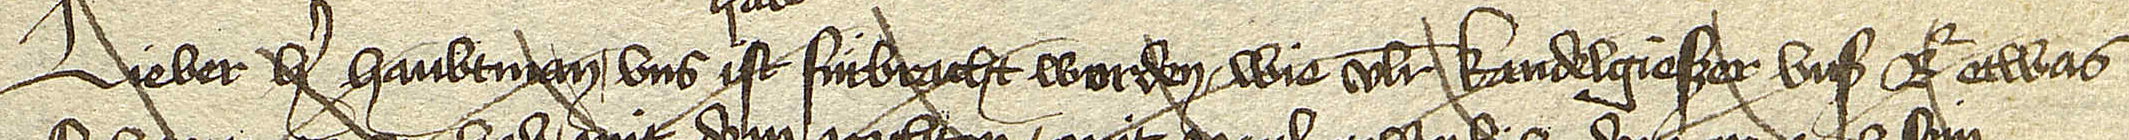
Lieber h* haubtman / vns iſt fürbracht worden / wie vlr* Kandelgieſʒer vnſ* B* etwas
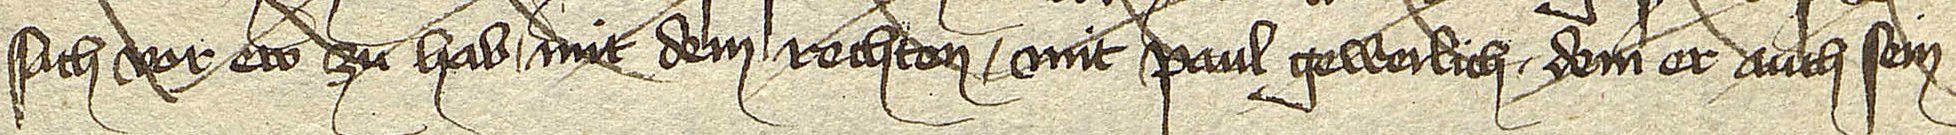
ſach vor ew cʒu hab / mit dem rechten / mit Paul gewerlich / dem er auch ſein
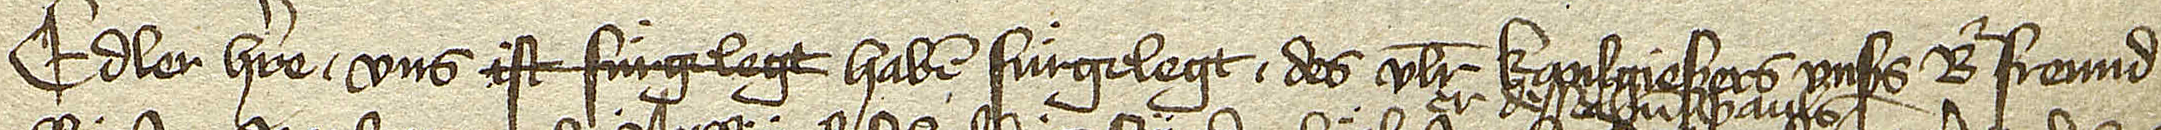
Edler h*re / vns iſt fürgelegt habe* fürgelegt / des vlr* Kanlgieſʒers vnſ*s B* freund
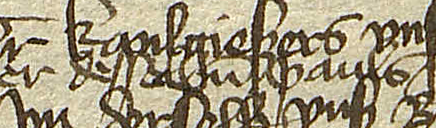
er deſſelbn* Pauls
